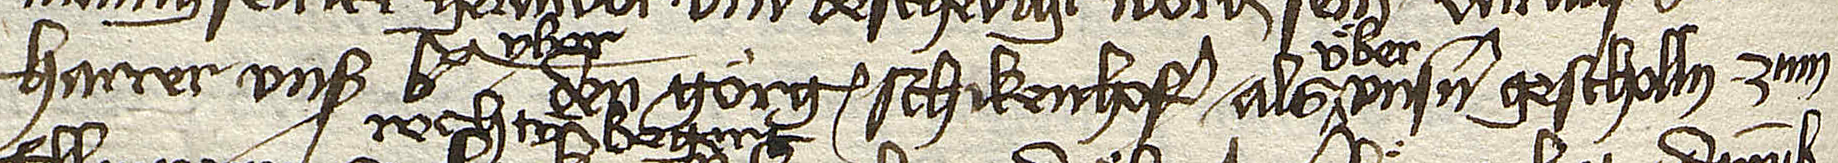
Harrer vnſ* b* / den görg* ſchikenhof* / als vnſn* geſcholln ʒum
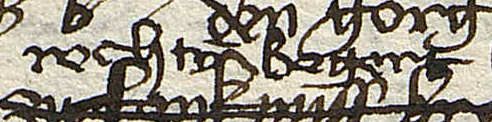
rechts begert
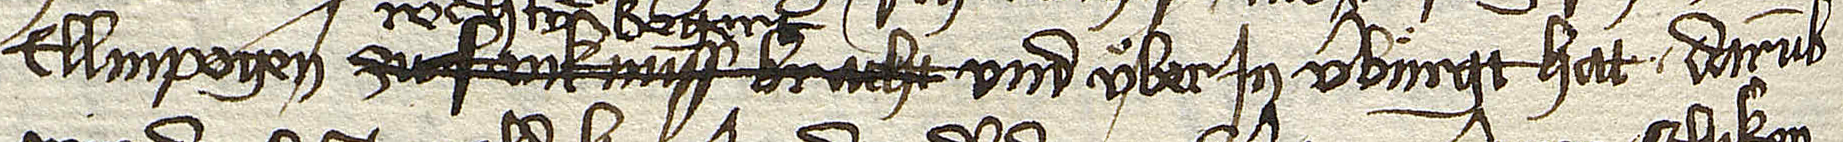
Ellmpogen ʒufenknuſſ bracht vnd v̈ber In v*bürgt hat / Darub*
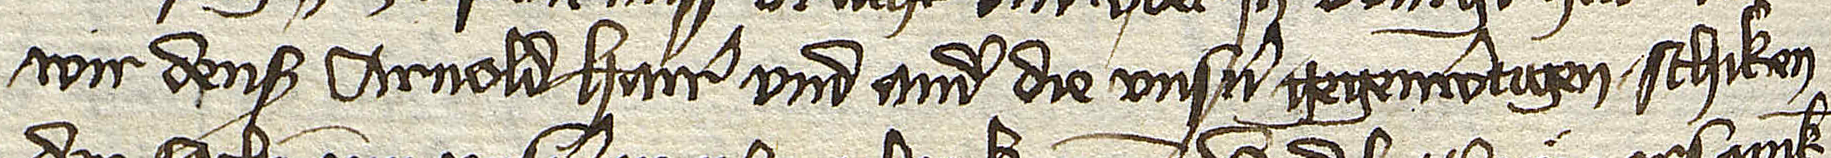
wir denſ* Arnold Harr* vnd and* die vnſn* gegenw*tigen / ſchiken
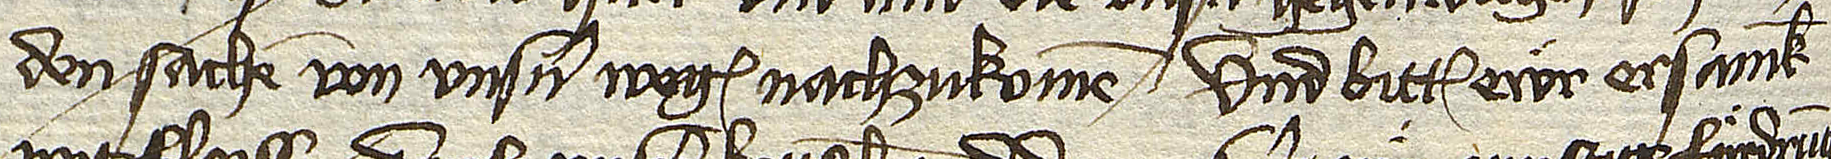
den ſache* von vnſn* weg* nachʒukome* / Vnd bitt* eẅr erſamk*
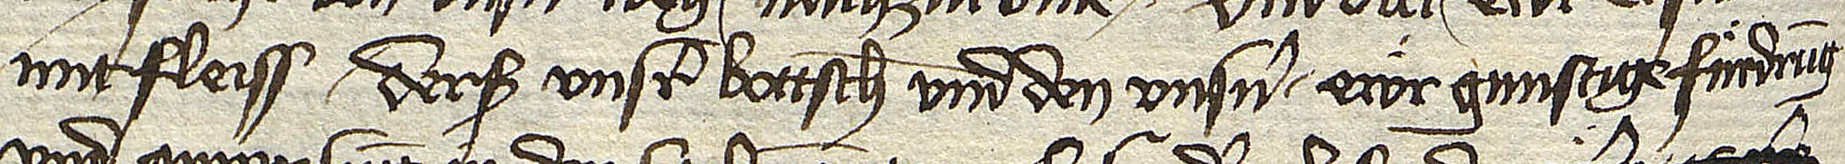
mit fleiſſ / Derſ* vnſr* bottſch* vnd den vnſn* / eẅr gunſtige fürdru*g
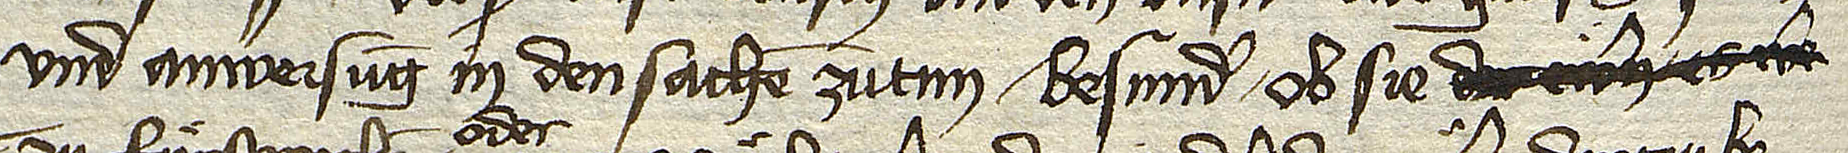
vnd anweiſu*g in den ſache* ʒutun / beſund* / ob ſie der eẅ*n es w*e
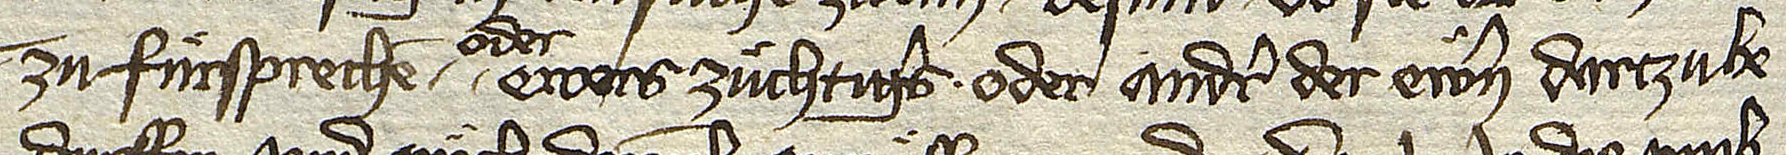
ʒu fürſpreche* / ewers ʒüchtig*s . oder andr* der eẅ*n darcʒu be
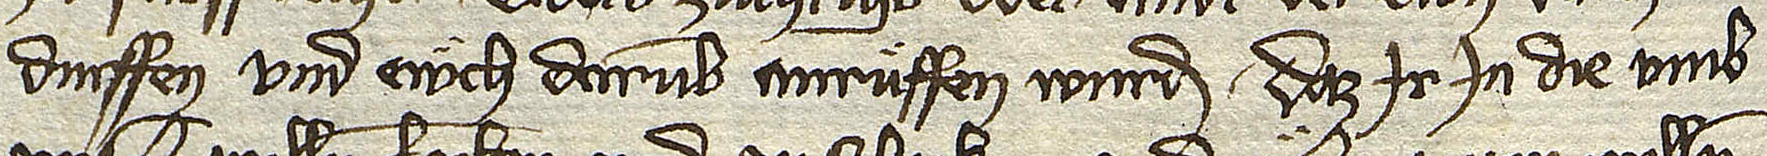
durffen vnd eẅch darub* anrüffen wurd* / Daʒ Ir In die vmb
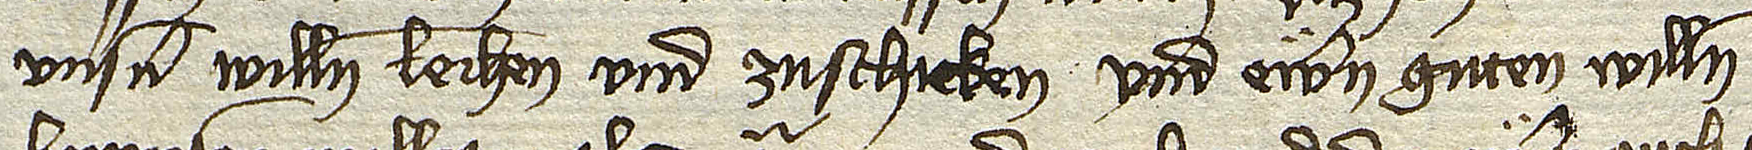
vnſn* willn* leihen vnd ʒuſchicken vnd eẅ*n guten willn*
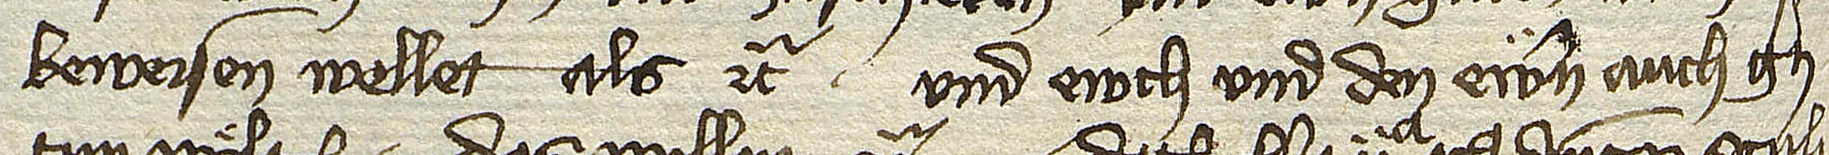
beweiſen wellet als ec* / vnd ewch vnd den eẅ*n auch g*n
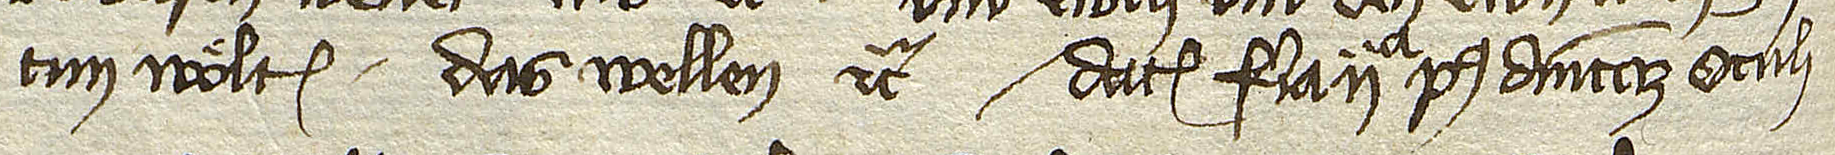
tun wölt* / das wellen ec* / dat* fi*a ii* p* dni*ca* Oculi
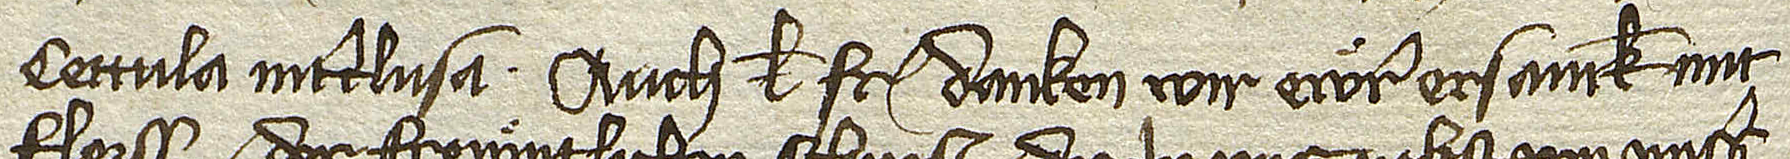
Cettula int*cluſa . Auch L* fr* danken wir eẅr* erſamk* mit
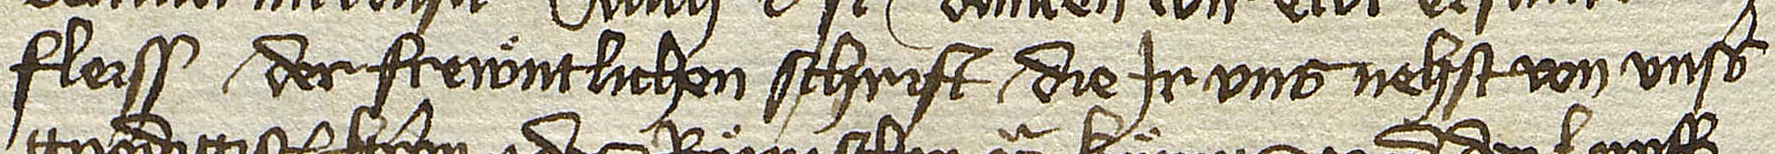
fleiſſ / der freẅntlichen ſchrift / die Ir vns nehſt von vnſ*s
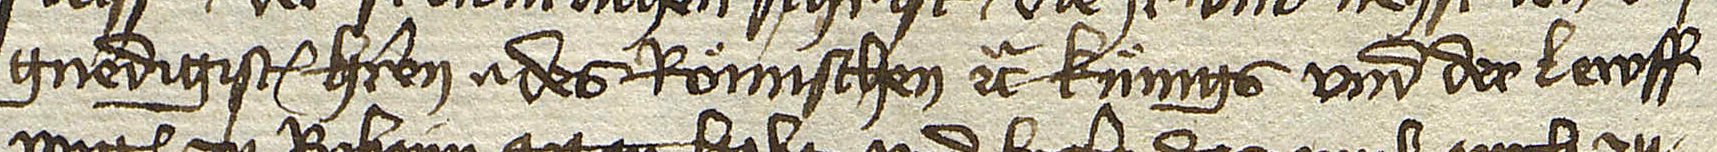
gnedigiſt* h*ren ~ des Römſchen ec* künigs vnd der lewff
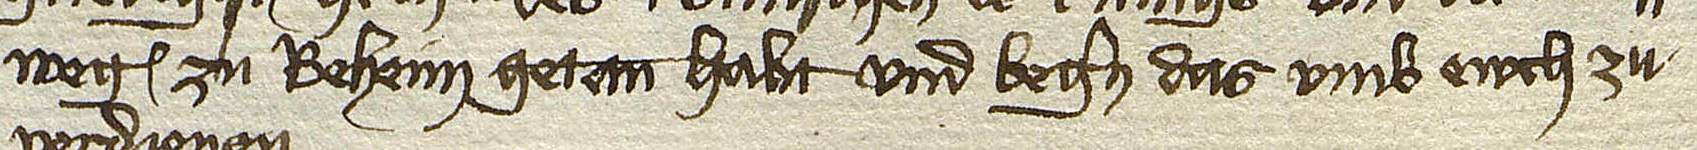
weg* ʒu Beheim getan habt vnd beg*n das vmb ewch ʒu
